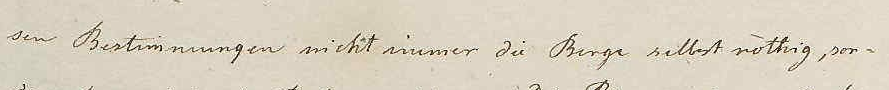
sen Bestimmungen nicht immer die Berge selbst nöthig, son-
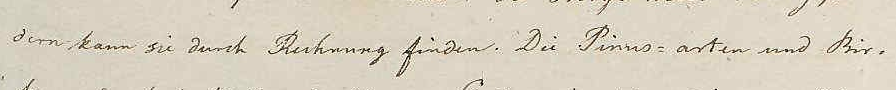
dern kann sie durch Rechnung finden. Die Pinus-arten und Bir-
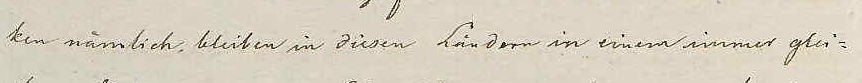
ken nämlich bleiben in diesen Ländern in einem immer glei-
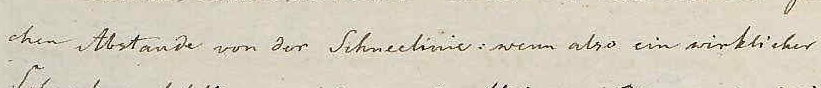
chen Abstande von der Schneelinie: wenn also ein wirklicher
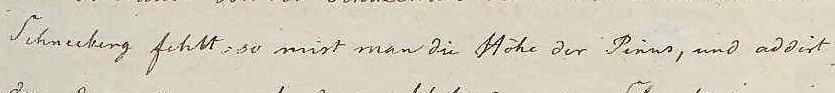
Schneeberg fehlt, so mist man die Höhe der Pinus, und addirt
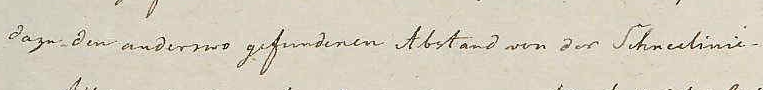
dazu den anderswo gefundenen Abstand von der Schneelinie.
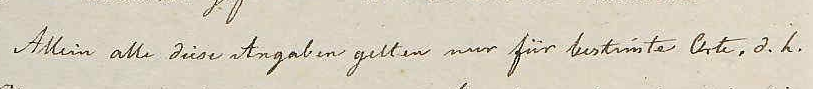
Allein alle diese Angaben gelten nur für bestimte Orte, d. h.
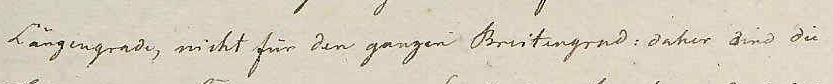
Längengrade, nicht für den ganzen Breitengrad: daher dsind die
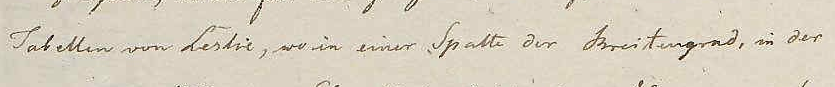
Tabellen von Leslie, wo in einer Spalte der Breitengrad, in der
